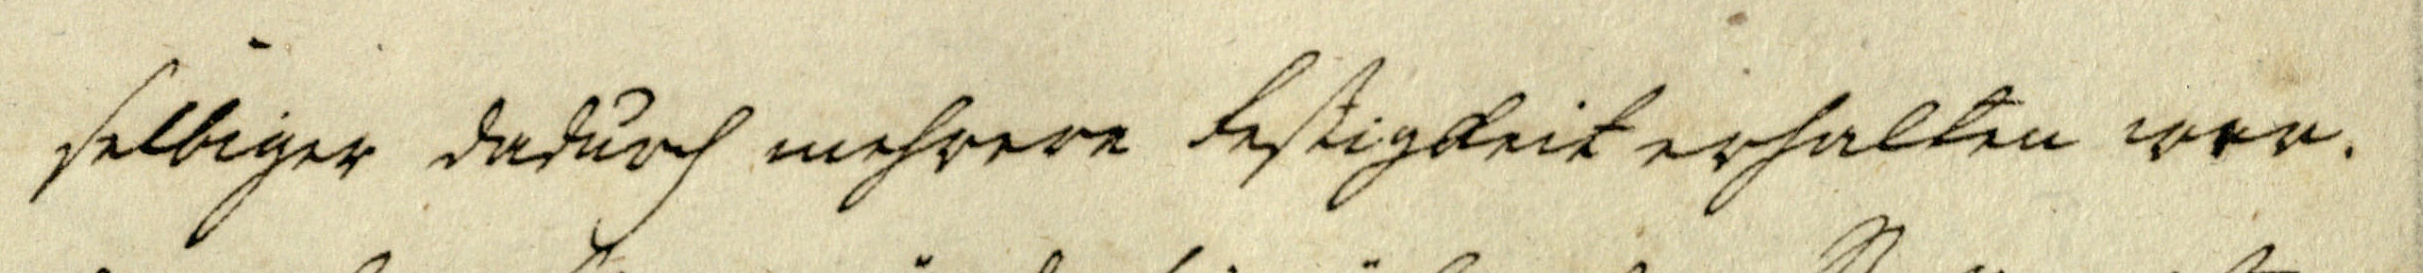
selbiger dadurch mehrere Festigkeit erhalten wer¬
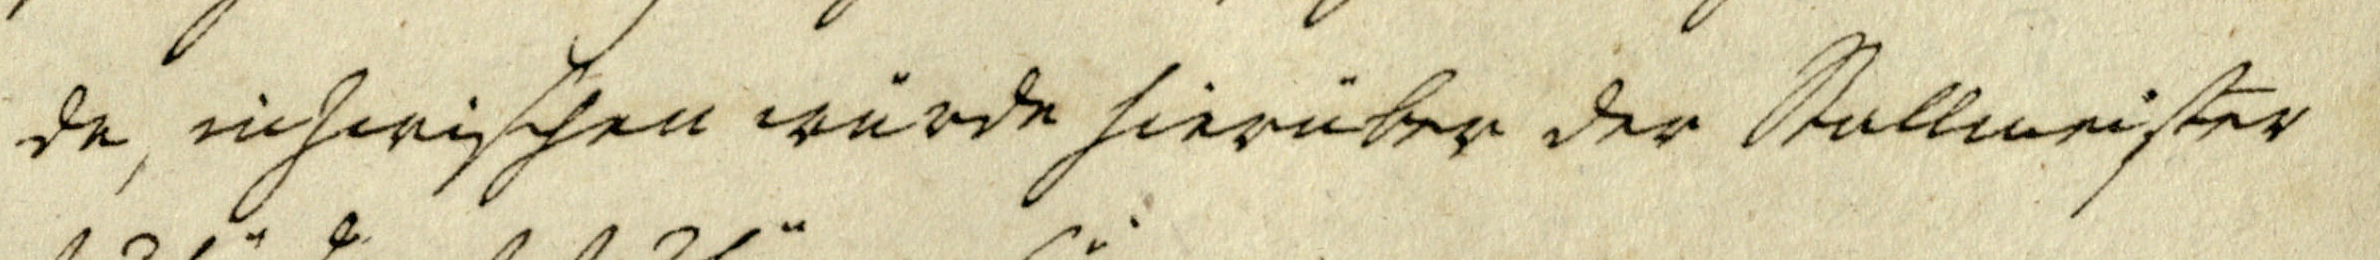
de, inzwischen würde hierüber der Stallmeister
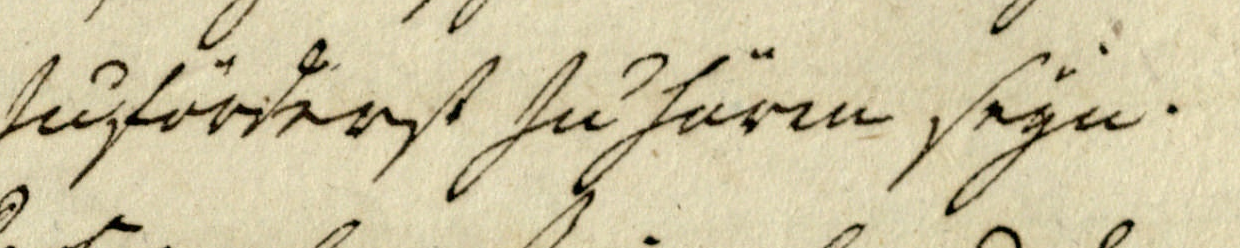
zuförderst zu hören seÿn.
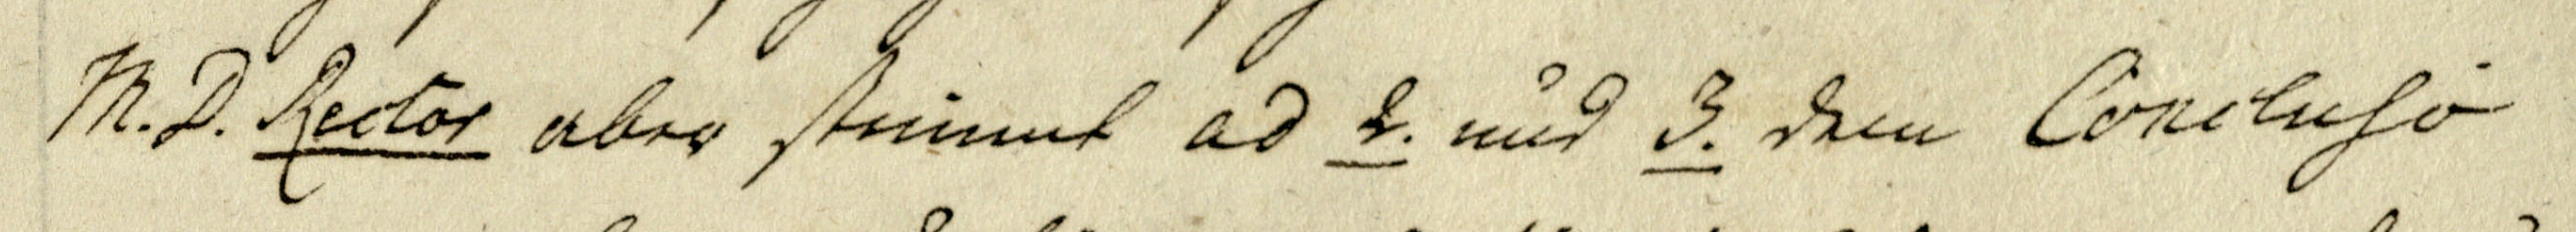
M. D. Rector aber stimmt ad 2. und 3. dem Concluso
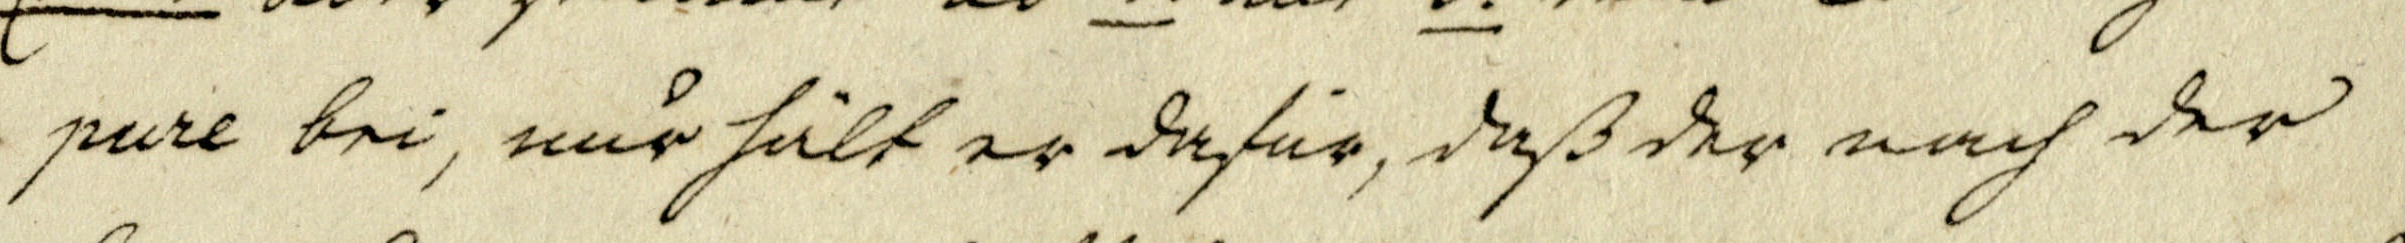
pure bei, nur hält er dafür, daß der nach der
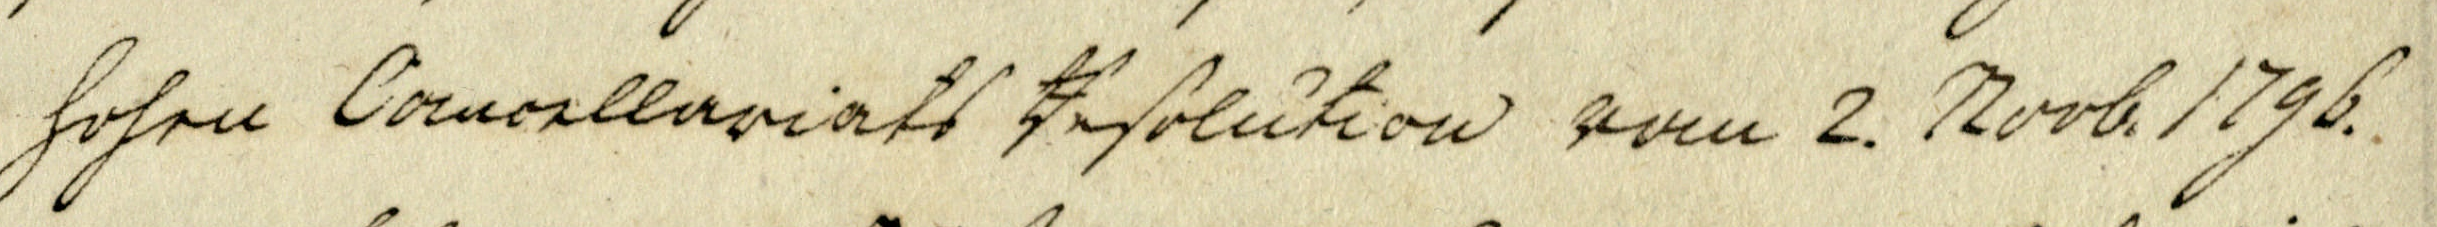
Hohen Cancellariats Resolution vom 2. Novb. 1796.
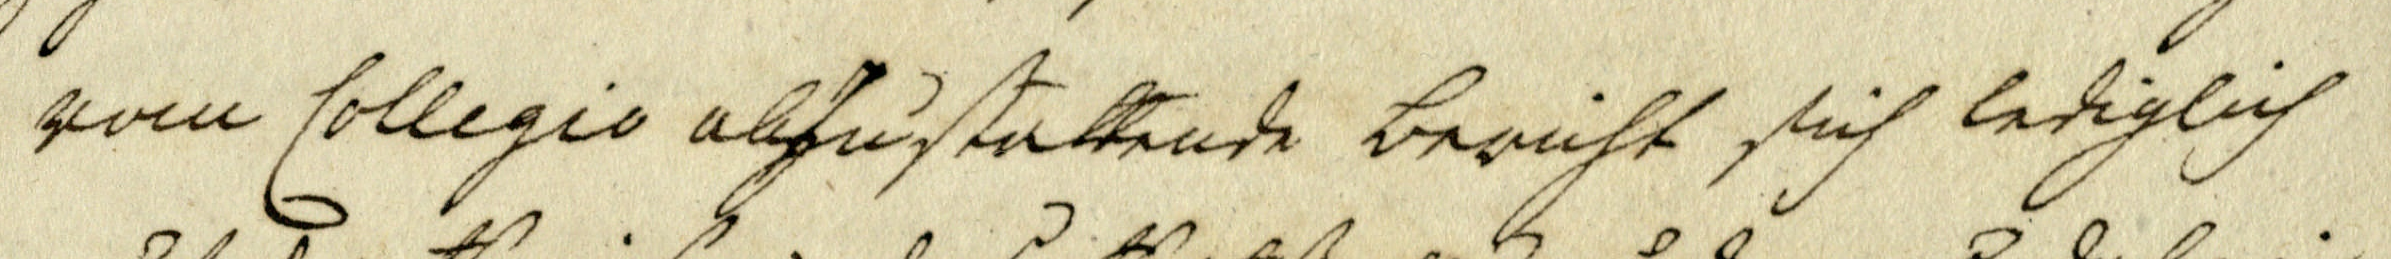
vom Collegio abzustattende Bericht sich lediglich
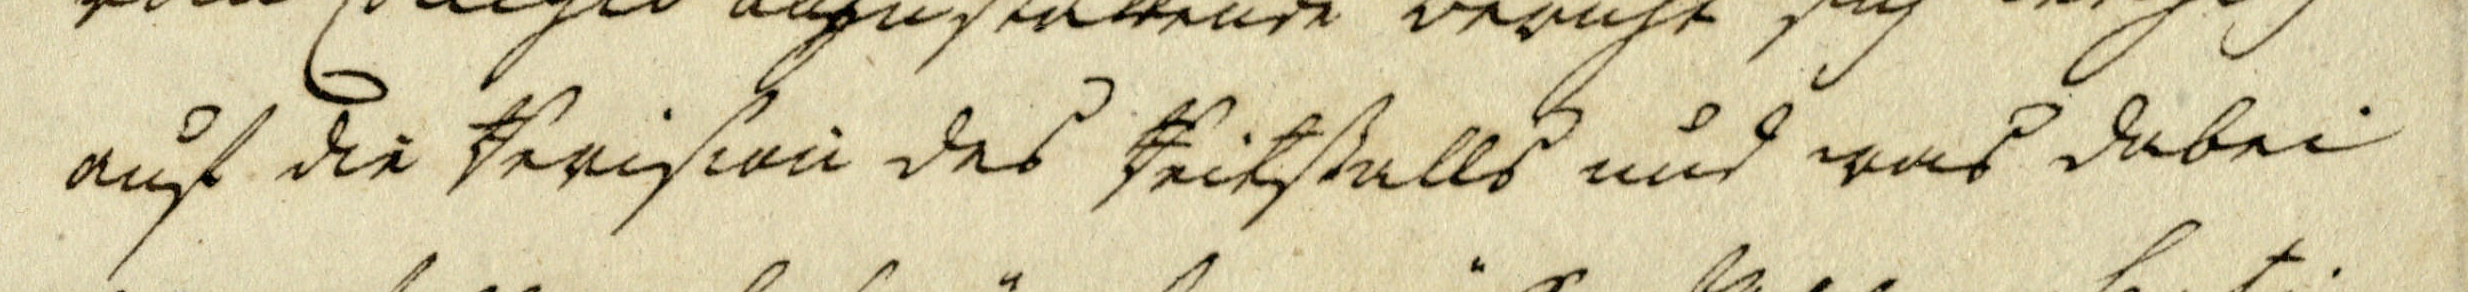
auf die Revision des Reitstalls und was dabei
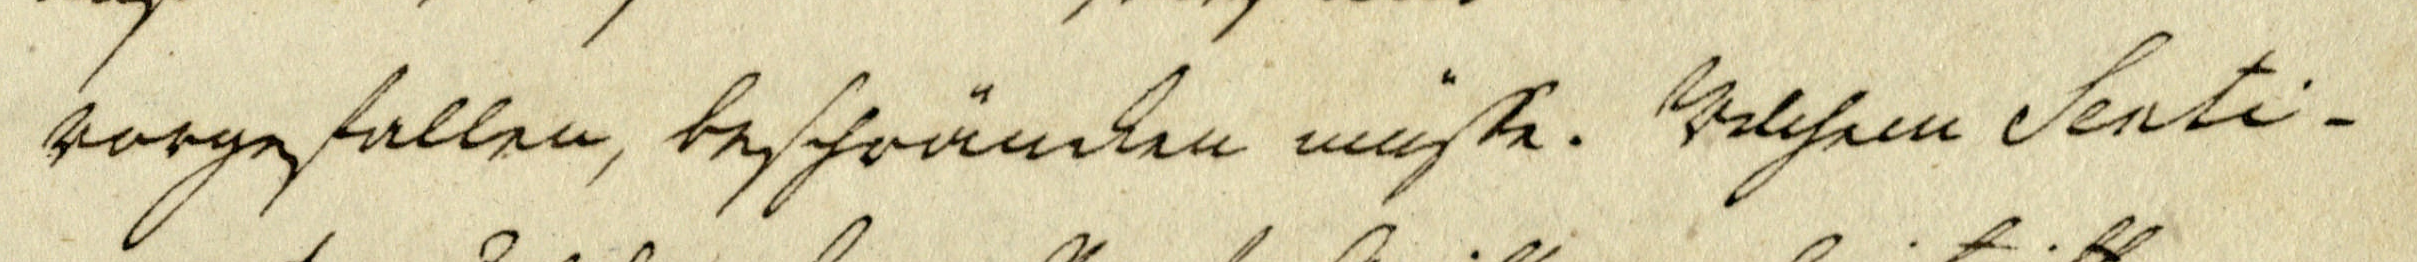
vorgefallen, beschräncken müsse. Wilchem Senti¬
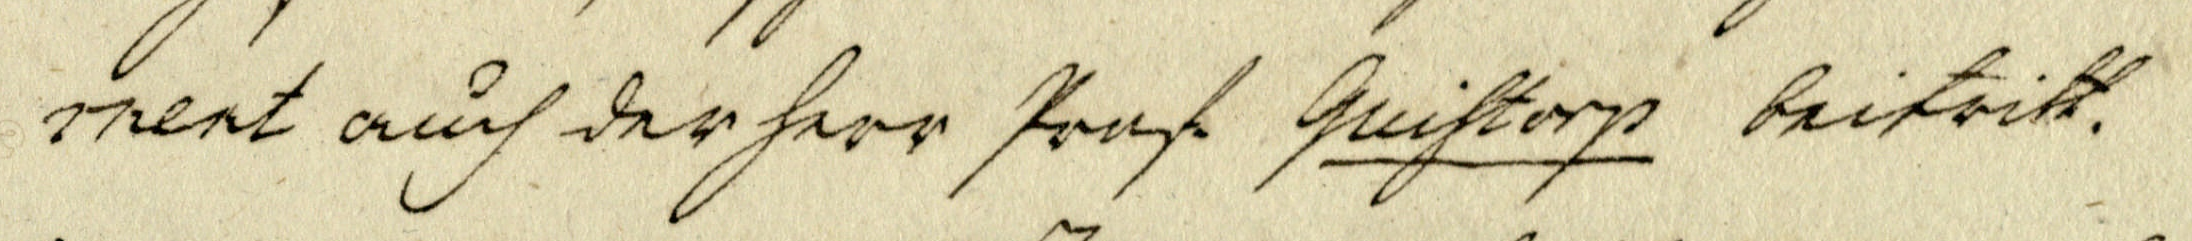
ment auch der Herr Prof. Quistorp beitritt.
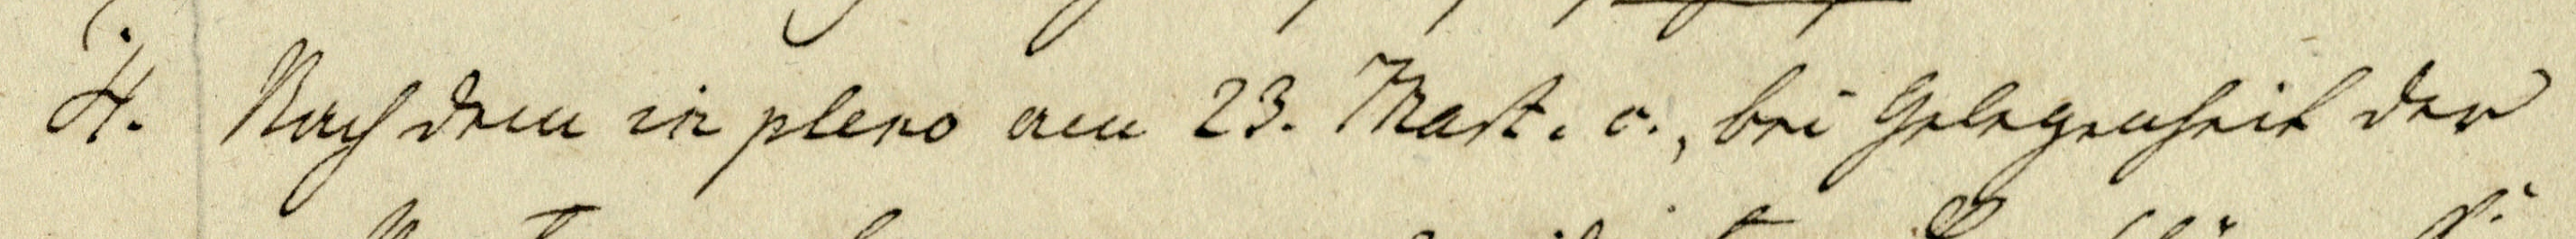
4. Nach dem in pleno am 23. Mart. c., bei Gelegenheit der
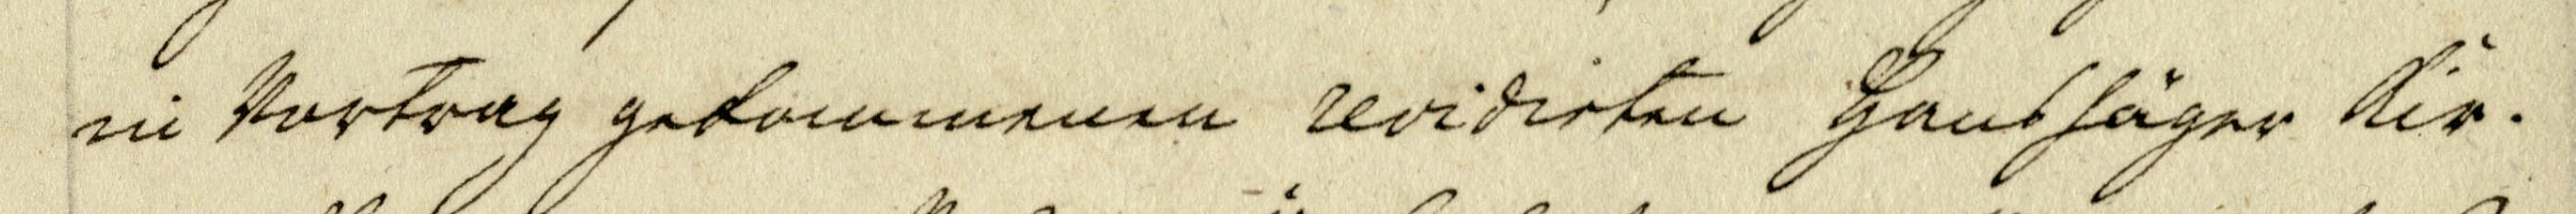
in Vortrag gekommenen revidirten Hanshäger Kir¬
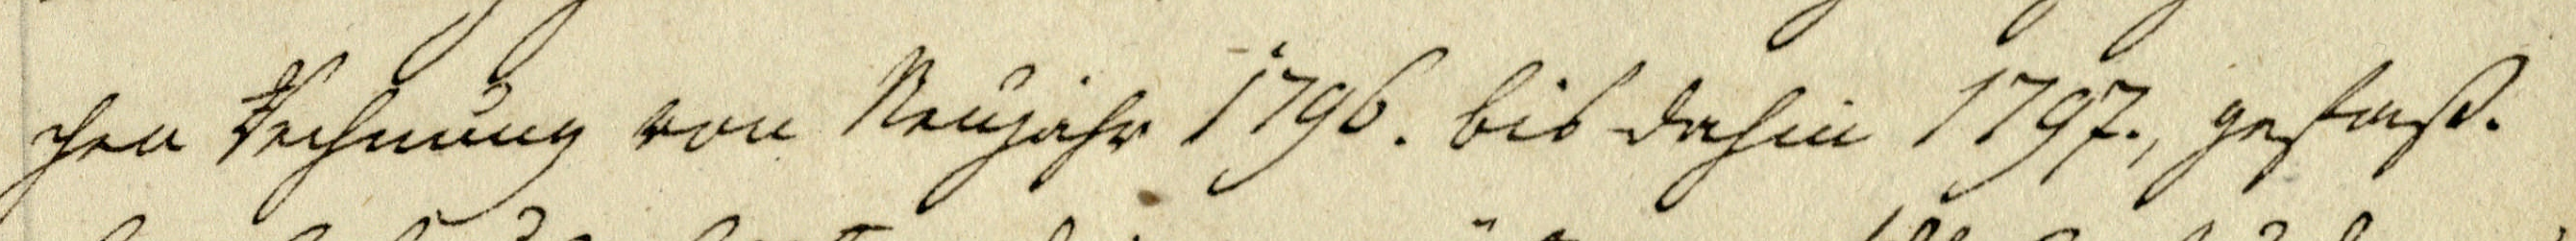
chen Rechnung von Neujahr 1796. bis dahin 1797., gefaß¬
